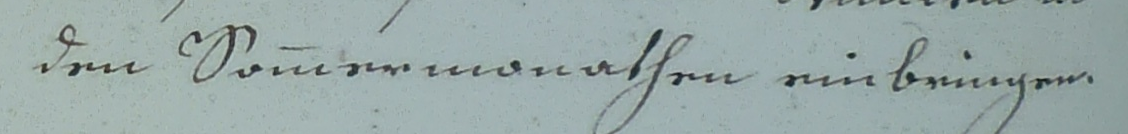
den Som̅ermonathen einbringen.
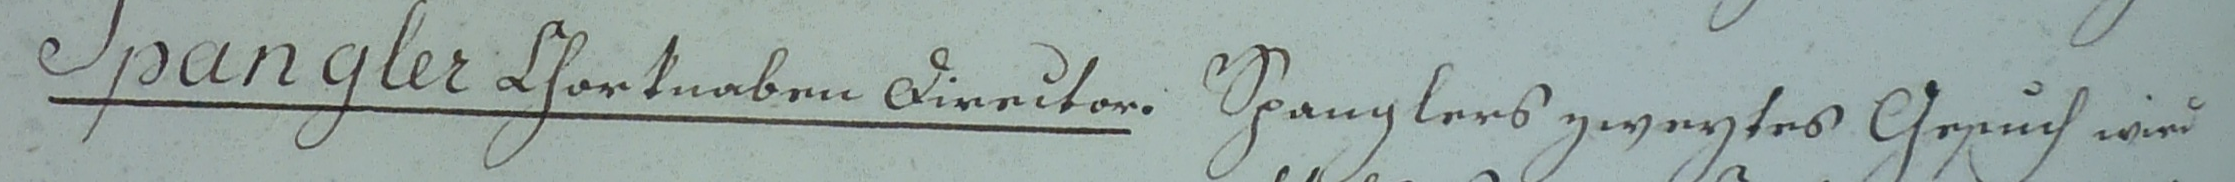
Spangler Chorknaben Director. Spanglers zweytes Gesuch wird
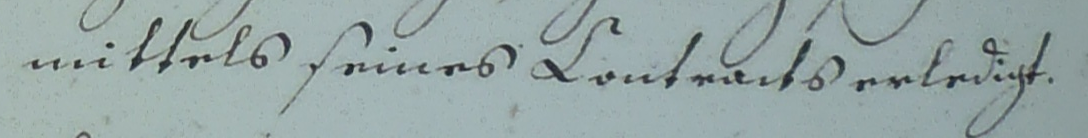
mittels seines Contracts erledigt.
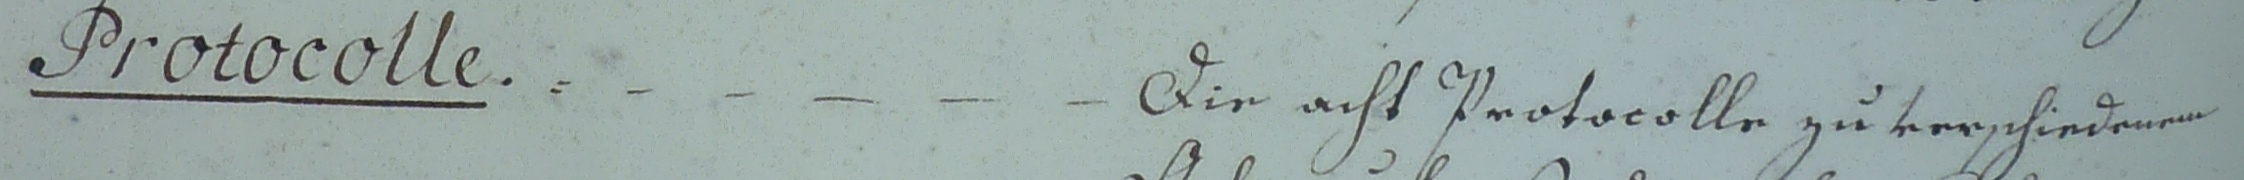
Protocolle . : _ _ _ _ _ Die acht Protocolle zu verschiedenem
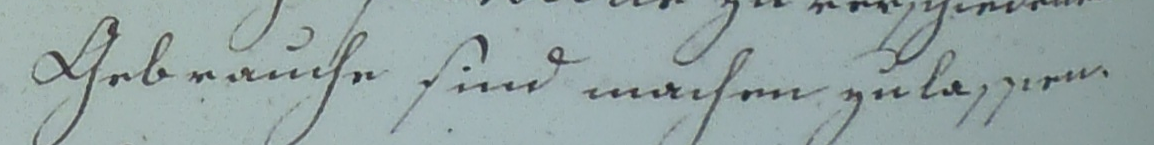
Gebrauche sind machen zulassen.
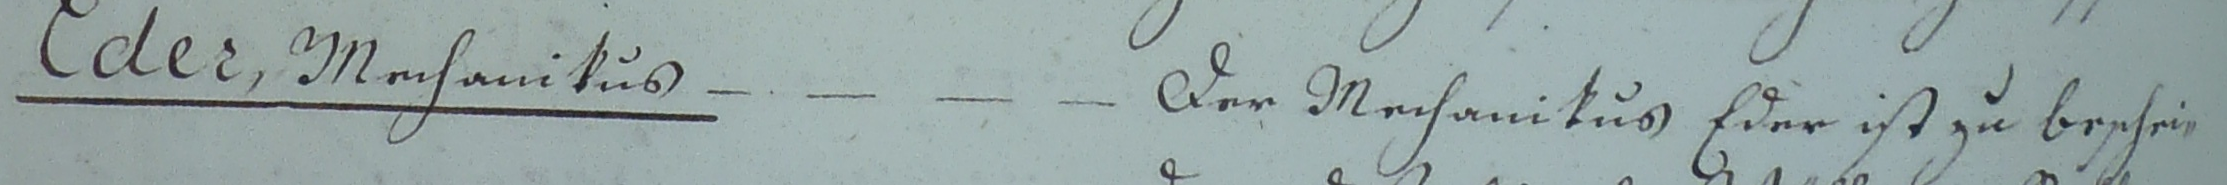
Eder, Mechanikus _ _ _ _ Der Mechanikus Eder ist zu beschei¬
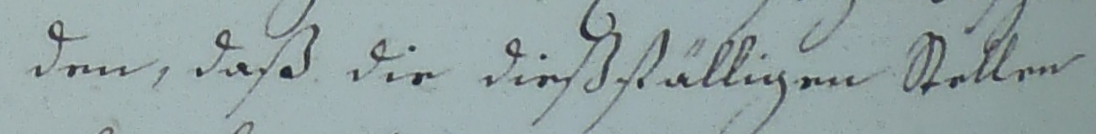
den, daß die dießfälligen Stellen
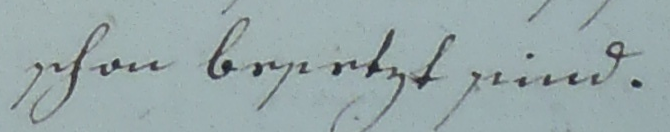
schon besetzt sind.
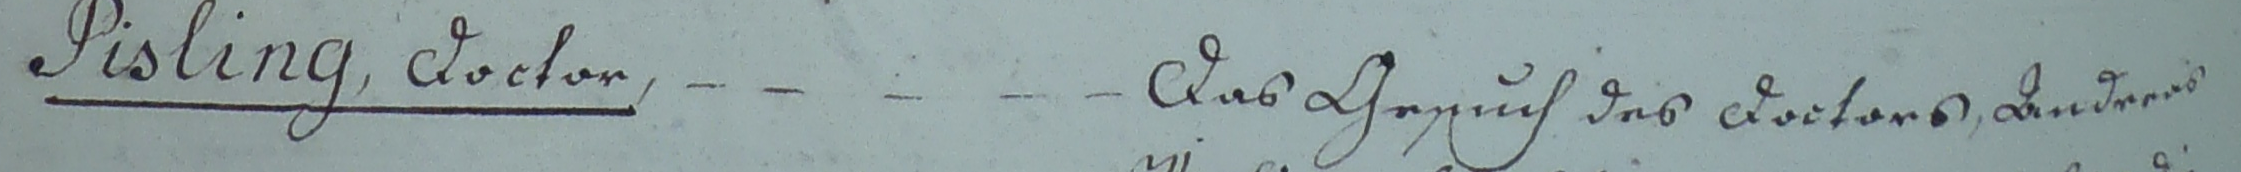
Pisling, Doctor, _ _ _ _ _ Das Gesuch des Doctors, Andreas
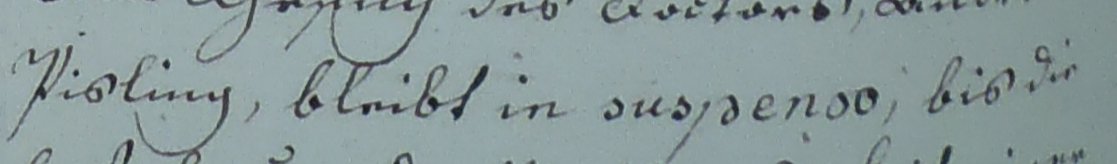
Pisling, bleibt in suspenso, bis die
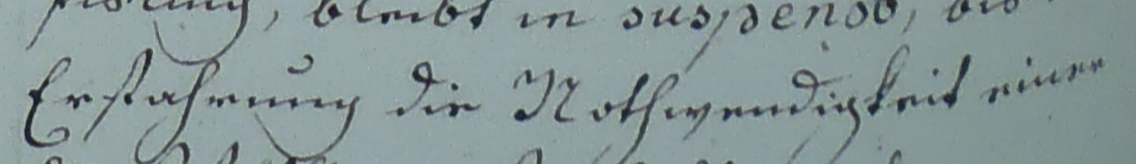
Erfahrung die Nothwendigkeit einer
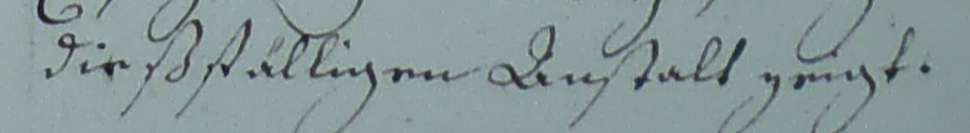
dießfälligen Anstalt zeigt.
